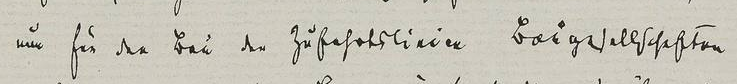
nun für den Bau der Zufahrtslinien Baugesellschaften
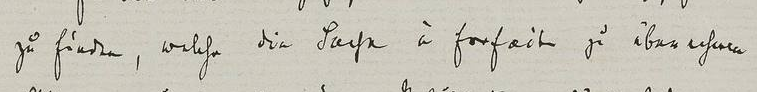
zu finden, welche die Sache à forfait zu übernehmen
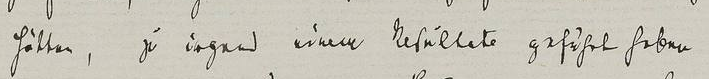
hätten, zu irgend einem Resultate geführt haben
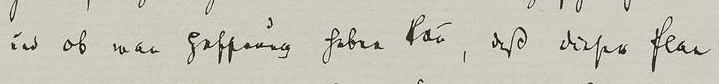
und ob man Hoffnung haben kann, daß dieser Plan
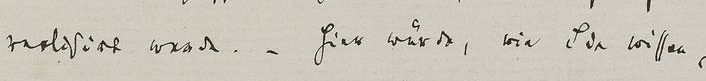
realisirt werde. – Hier würde, wie Sie wissen,
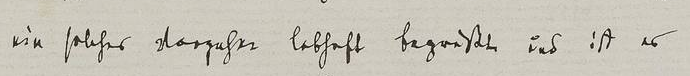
ein solches Vorgehen lebhaft begrüßt und ist es
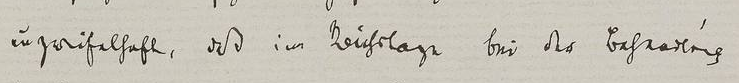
unzweifelhaft, daß im Reichstage bei der Behandlung
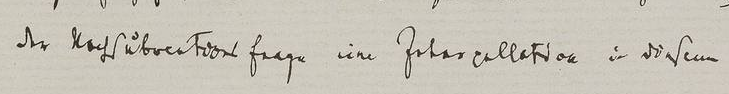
der Nachsubventionsfrage eine Interpellation in diesem
